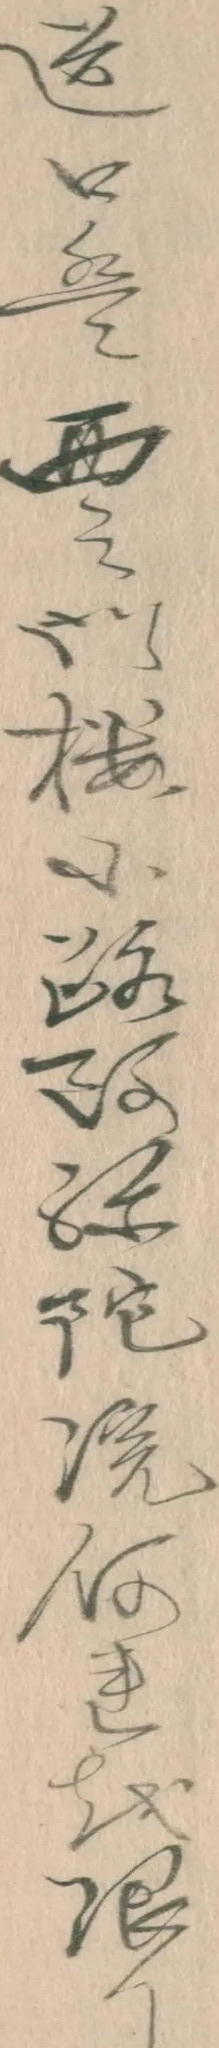道口は西之門桜小路阿弥陀院何れを限り
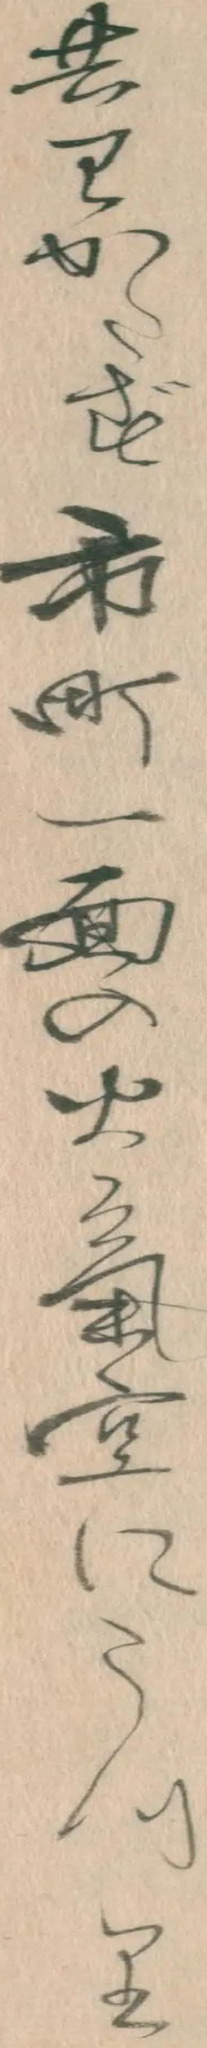共わかたず市町一面の火気空にうつり
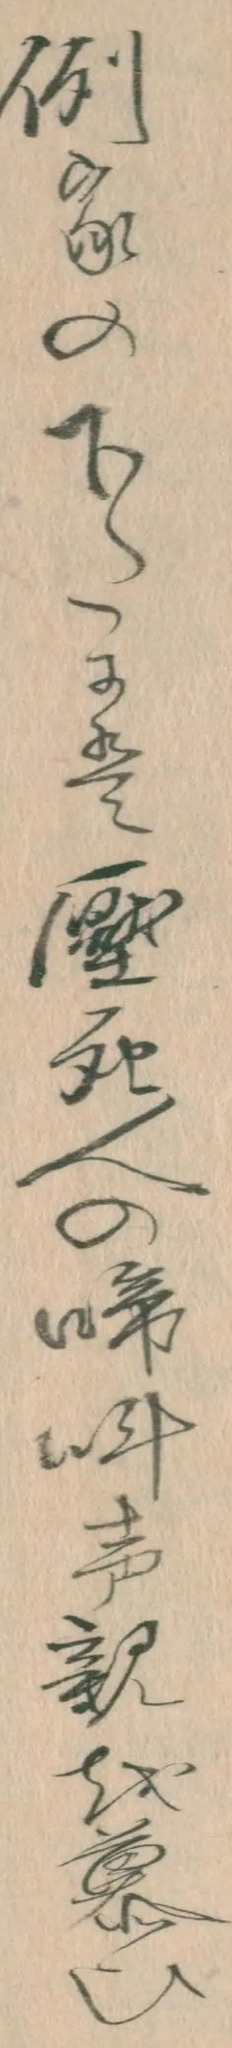倒家の下たには圧死人の啼叫声親を慕ひ
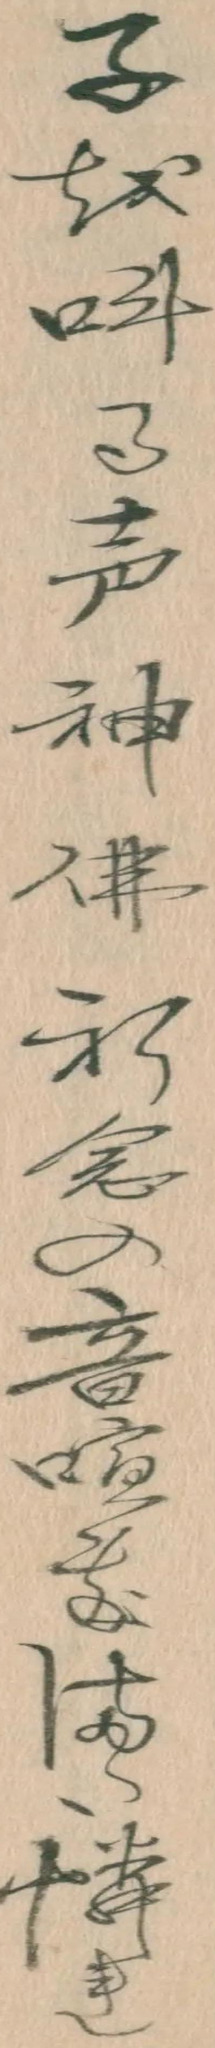子を叫る声神仏祈念の音喧敷また憐れ
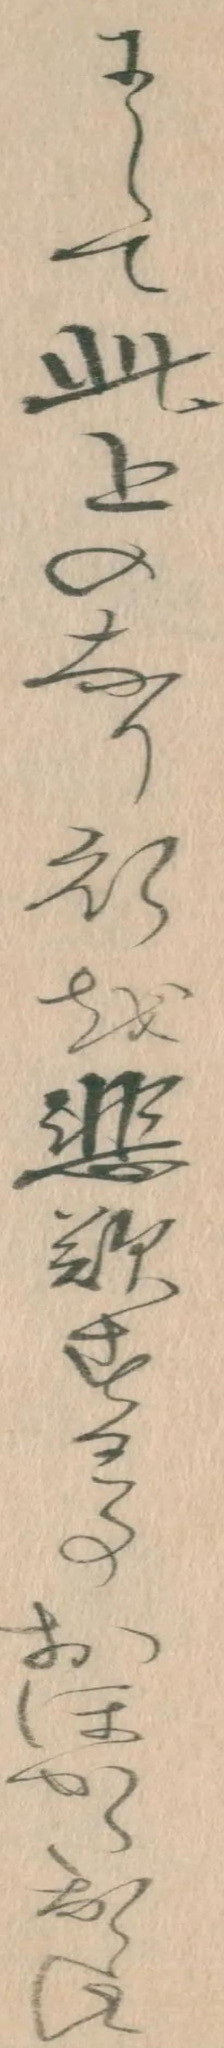にして此上のなり行を悲歎する事おほかたならす
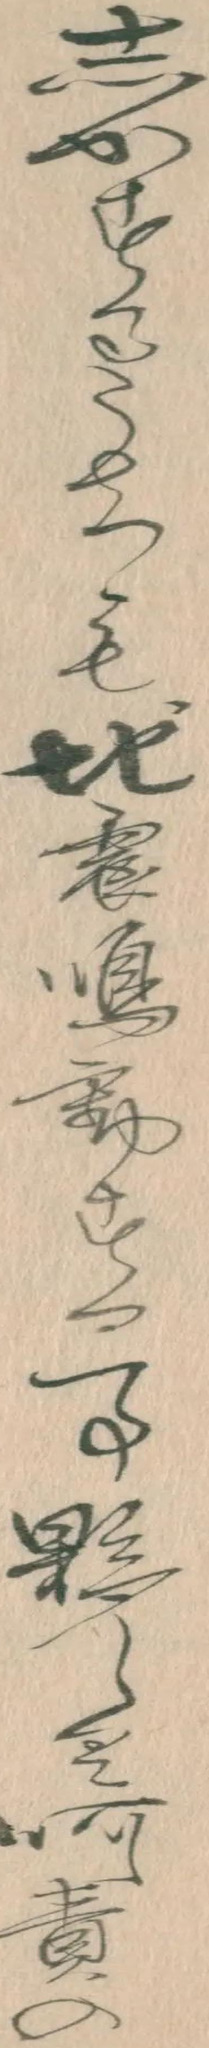しかするうちも地震鳴動する事夥しく呵責の
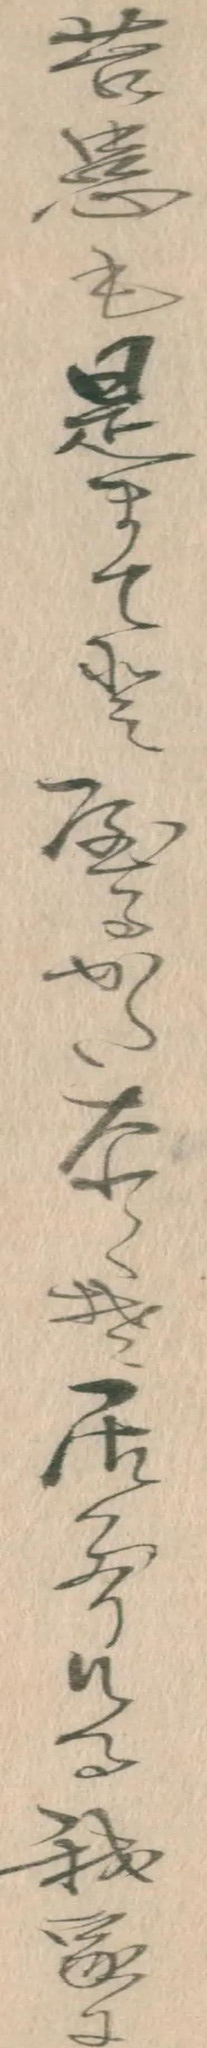苦患も是まてとやるかたなくそ居たりける我家に
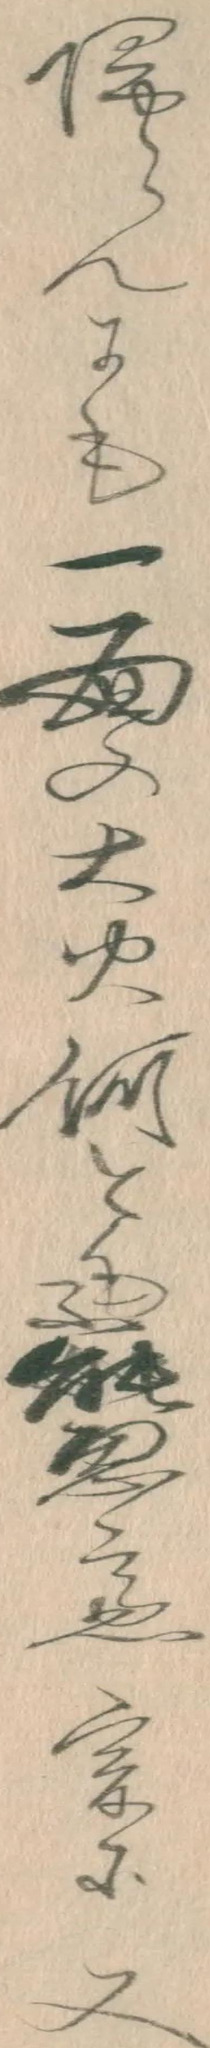帰らんにも一面の大火何とも不能思慮爰に又
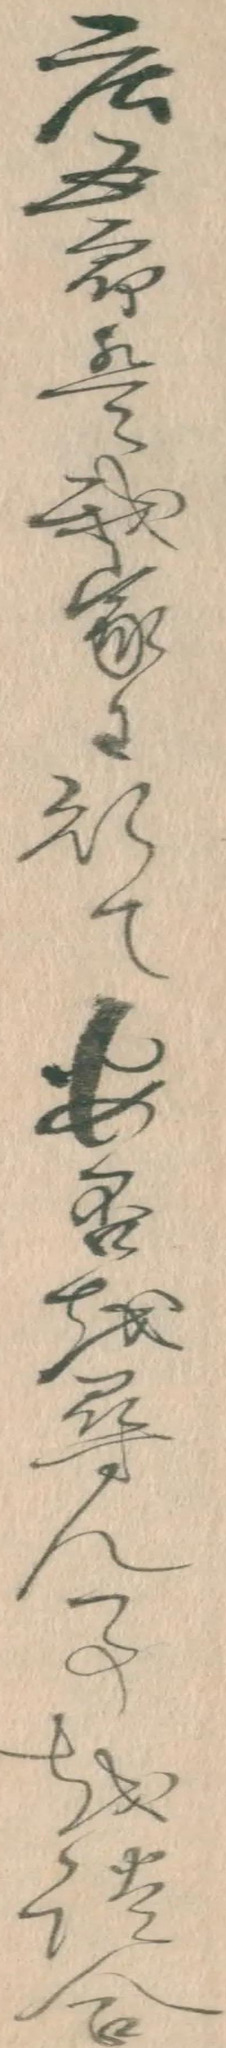庄五郎は我家に行て安否を尋ん事を談合
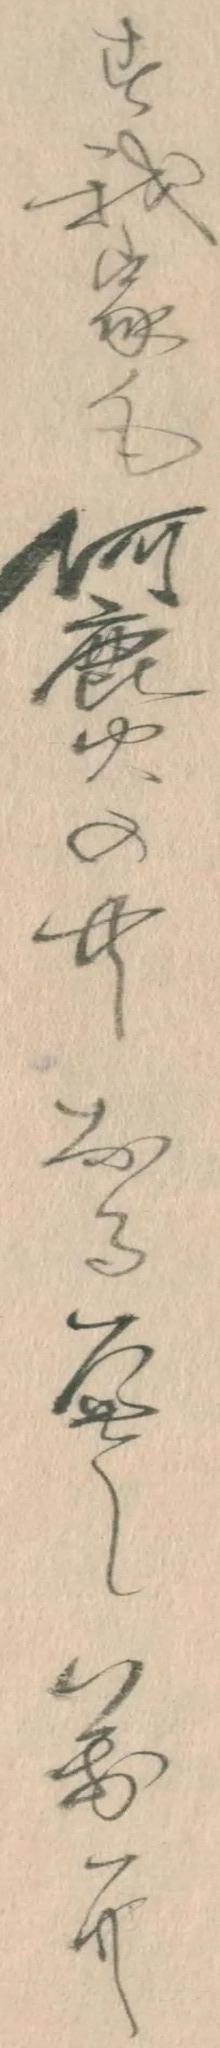す我家も何鹿火の中なるへし万に
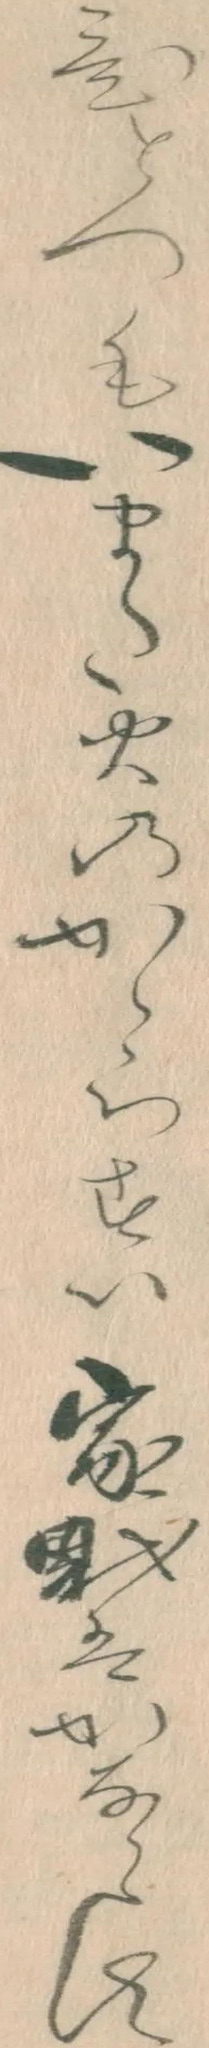ひとつもいまた火のかゝらすは家財はかならす
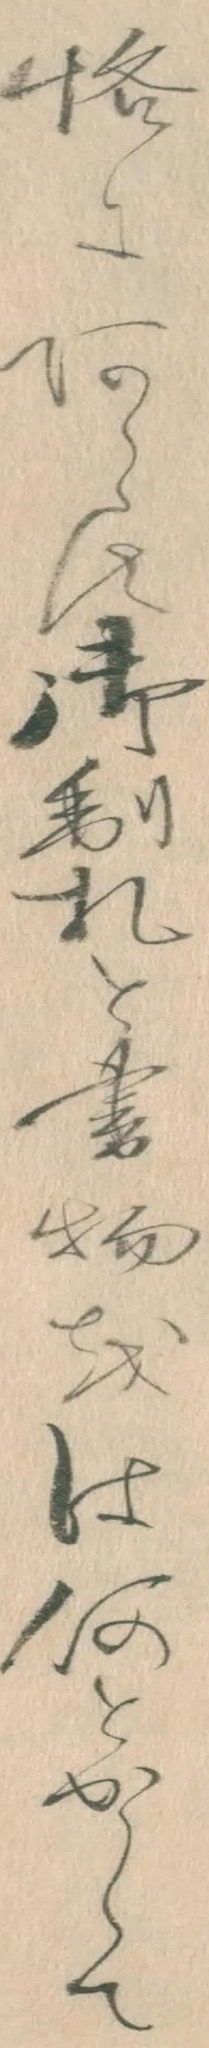恪にあらす御制札と書物をは何とかして
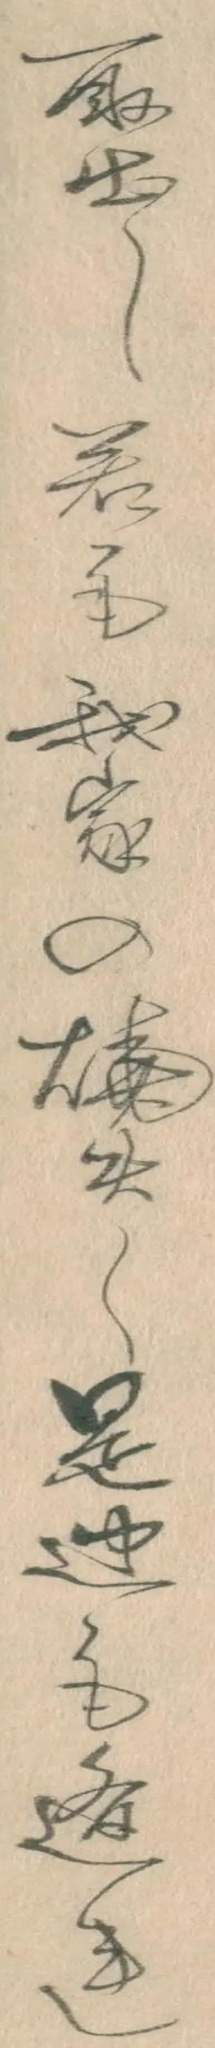取出し若も我家の焼失し是迚も遁れ

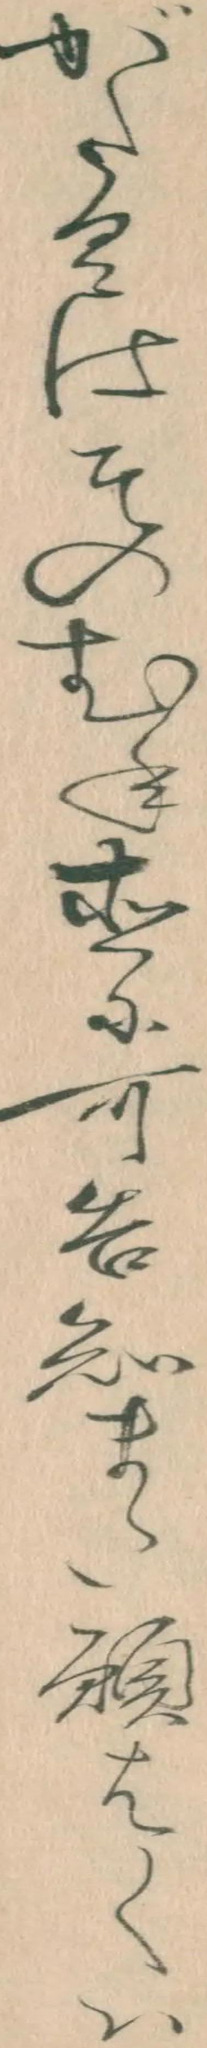がたくはそのむね直に可告知また願はくは
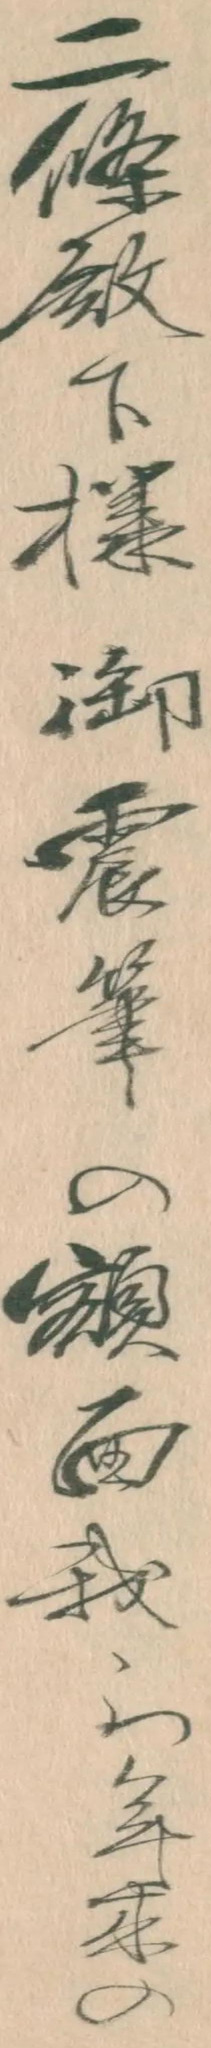二条殿下様御震筆の額面我ら年来の
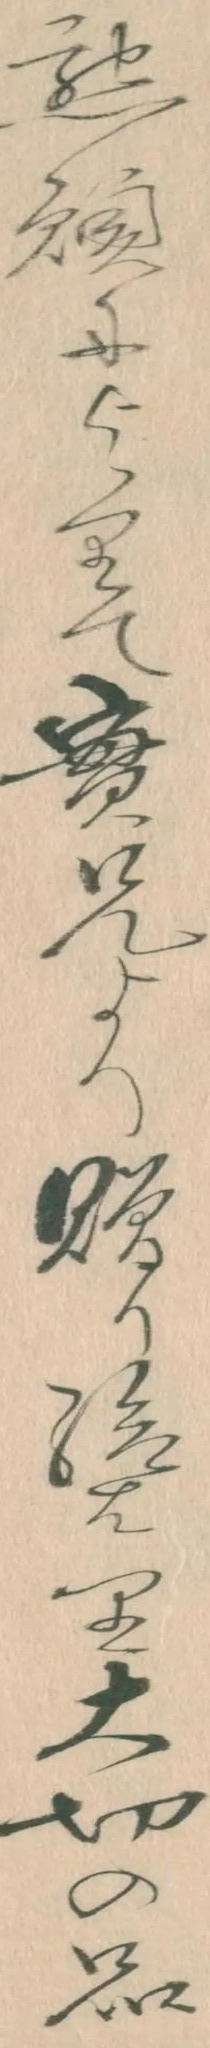懇願によりて実兄より贈り給はり大切の品
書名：俗語之種. [3]
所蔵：国立国会図書館 National Diet Library, JAPAN
